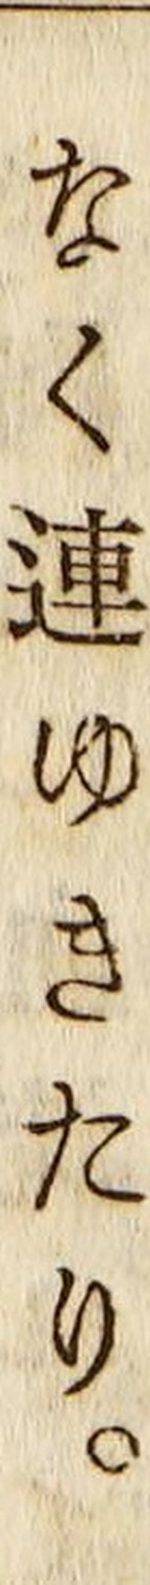なく連ゆきたり。
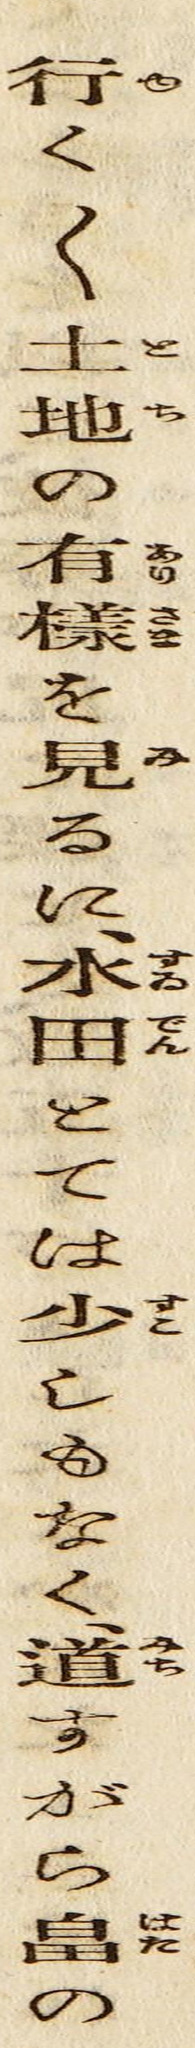行く〳〵土地の有様を見るに、水田とては少しもなく、道すがら畠の
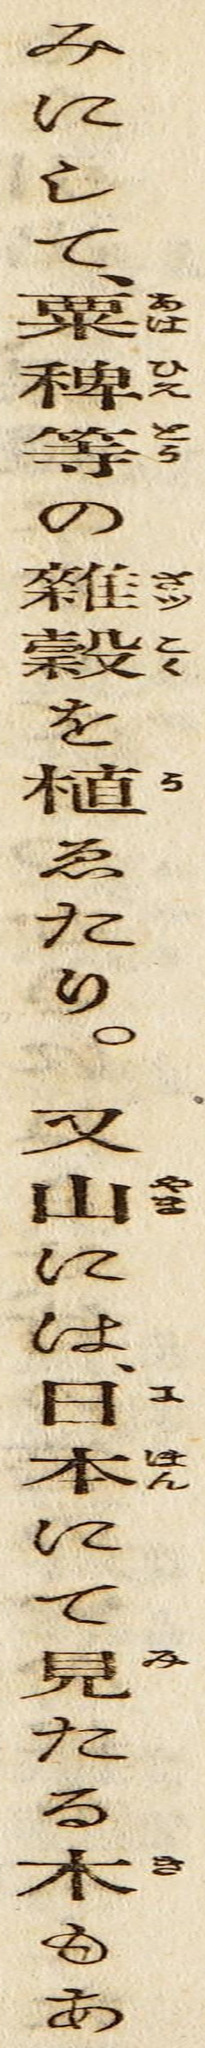みにして、粟稗等の雑穀を植ゑたり。又山には、日本にて見たる木もあ
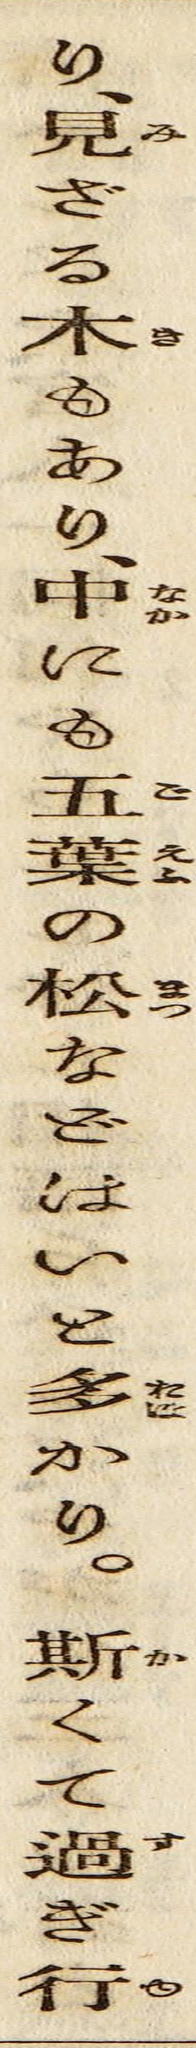り、見ざる木もあり、中にも五葉の松などはいと多かり。斯くて過ぎ行
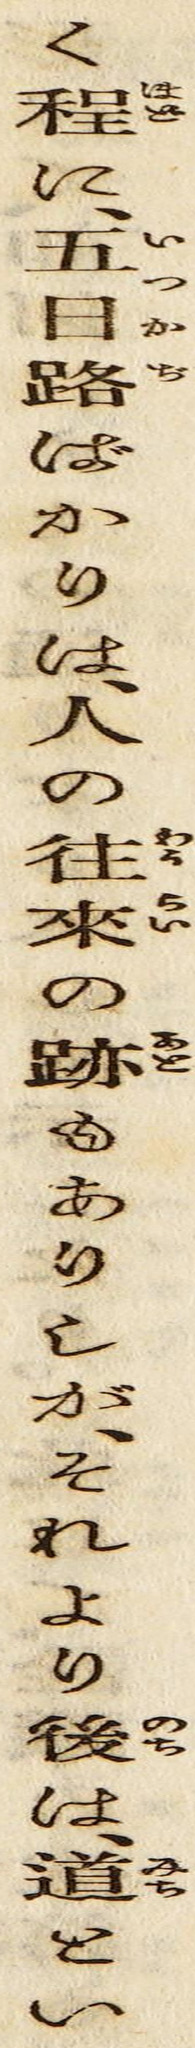く程に、五日路ばかりは、人の往来の跡もありしが、それより後は、道とい
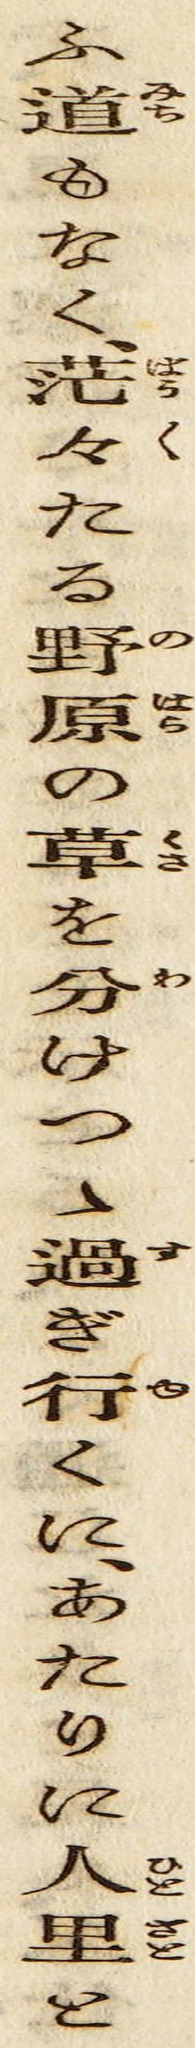ふ道もなく、茫々たる野原の草を分けつゝ過ぎ行くに、あたりに人里と
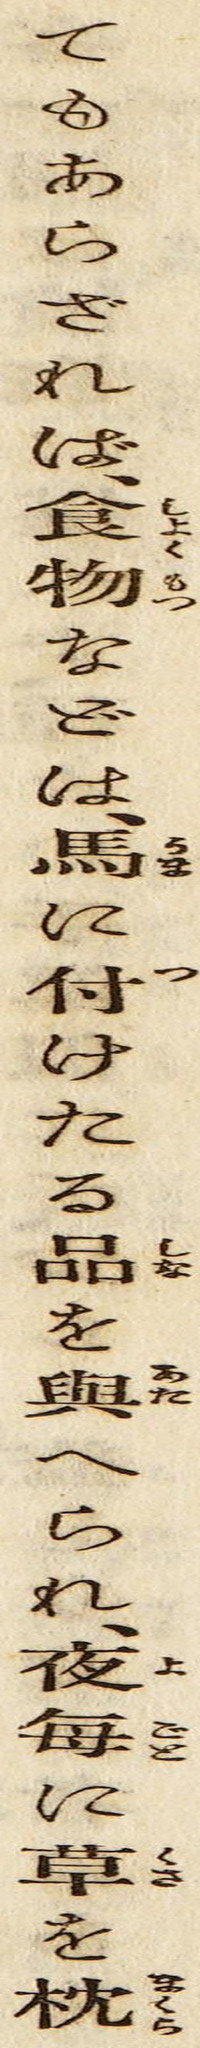てもあらざれば、食物などは、馬に付けたる品を与へられ、夜毎に草を枕
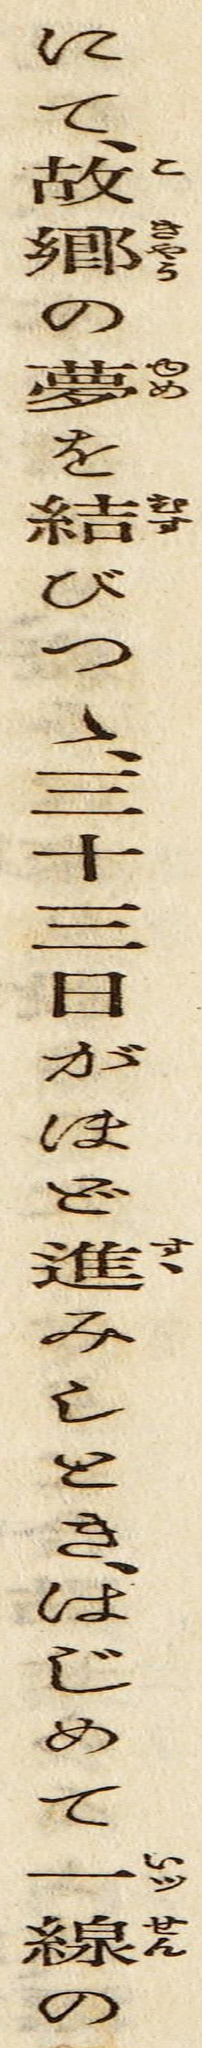にて、故郷の夢を結びつゝ、三十三日がほど進みしとき、はじめて一線の
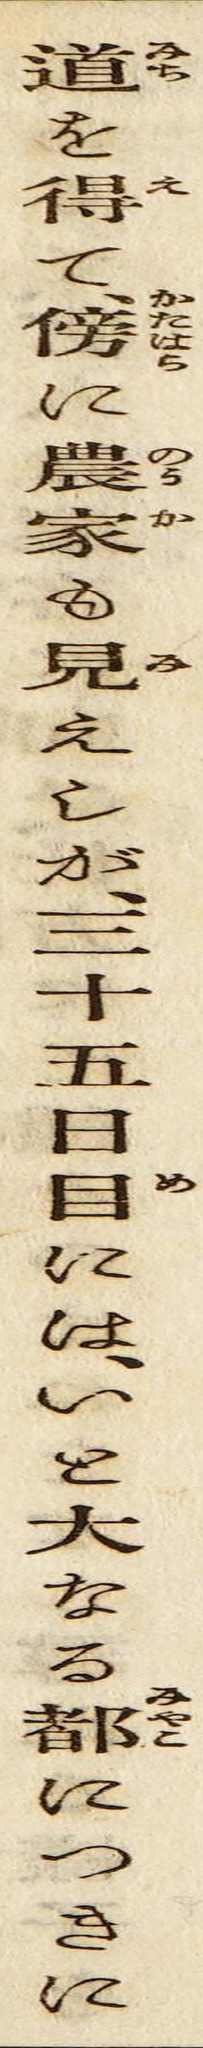道を得て、傍に農家も見えしが、三十五日目には、いと大なる都につきに
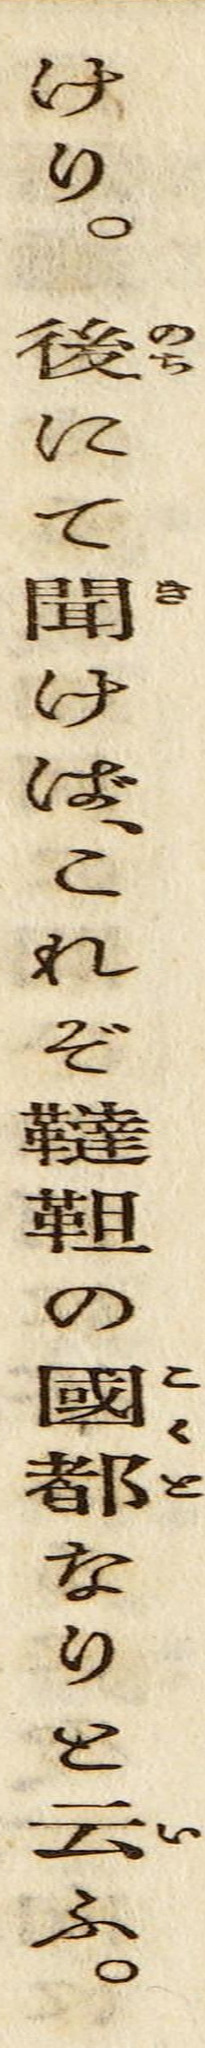けり。後にて聞けば、これぞ韃靼の国都なりと云ふ。
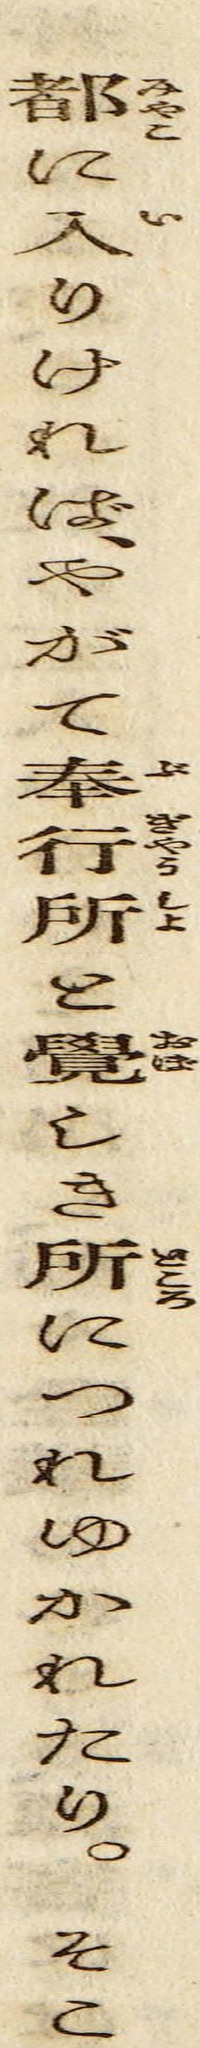都に入りければ、やがて奉行所と覚しき所につれゆかれたり。そこ
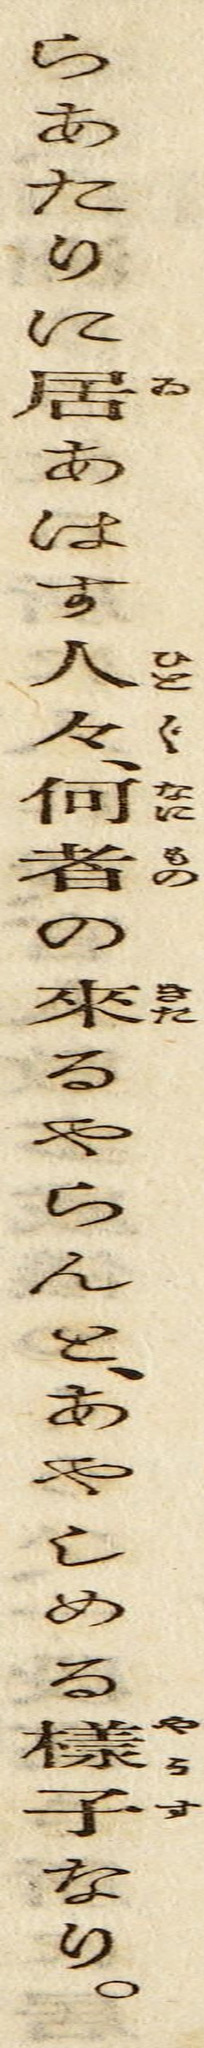らあたりに居あはす人々、何者の来るやらんと、あやしめる様子なり。

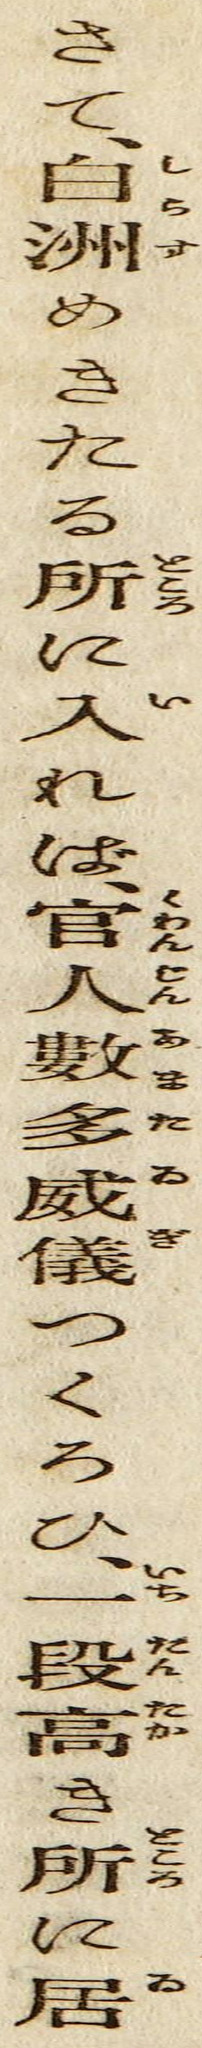さて、白洲めきたる所に入れば、官人数多威儀つくろひ、一段高き所に居
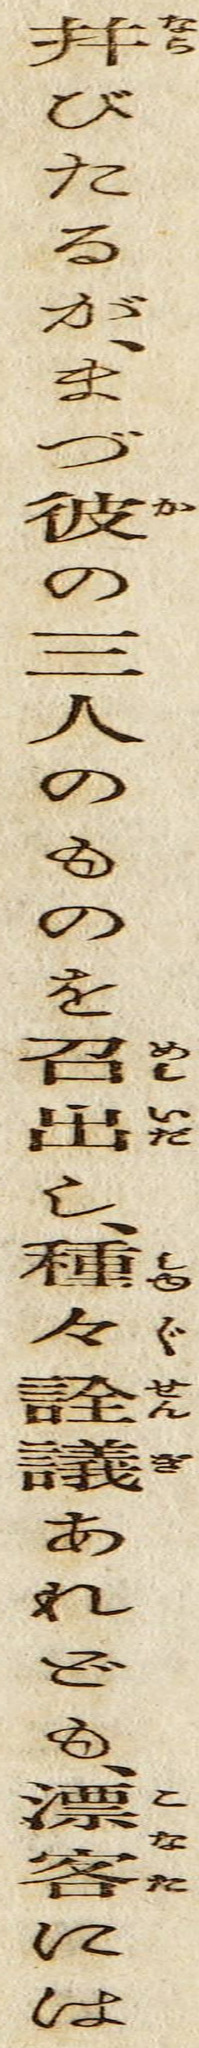并びたるが、まづ彼の三人のものを召出し、種々詮議あれども、漂客には
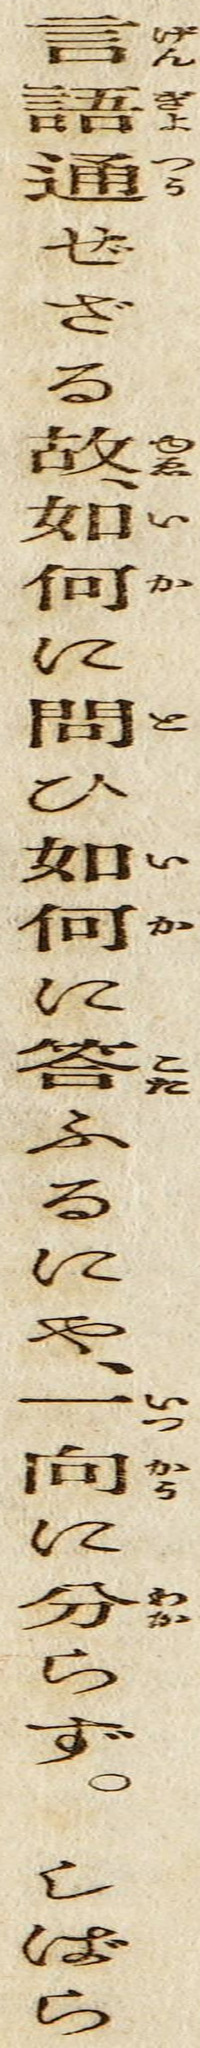言語通ぜざる故、如何に問ひ如何に答ふるにや、一向に分らず。しばら
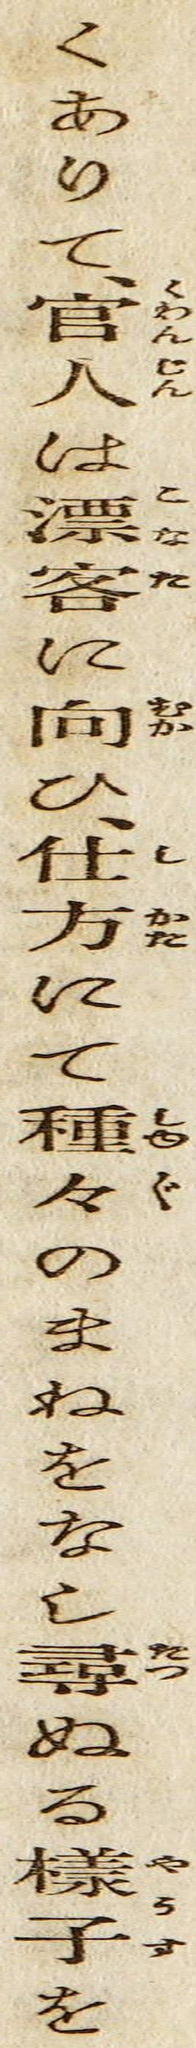くありて、官人は漂客に向ひ、仕方にて種々のまねをなし尋ぬる様子を
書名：日本漂流譚
